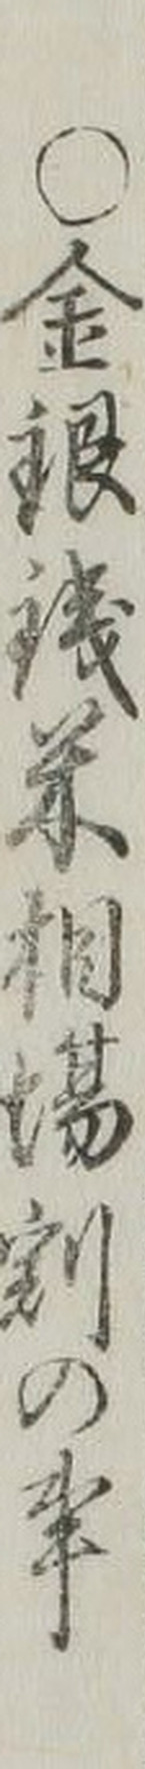○金銀銭米相場割の事
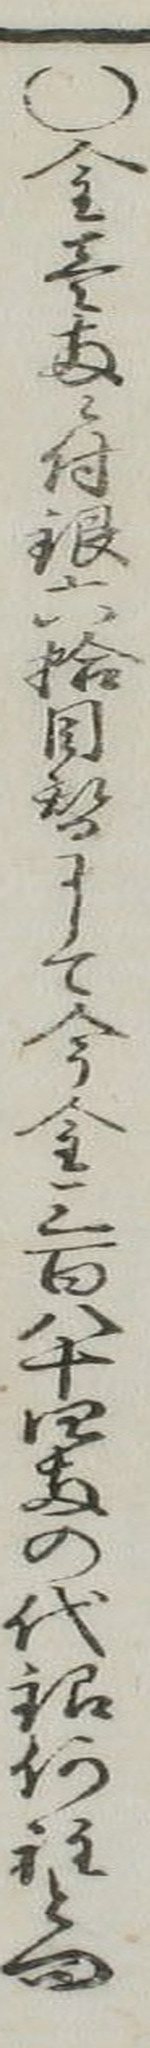○金壱両に付銀六拾目替にして今金三百八十四両の代銀何程と問
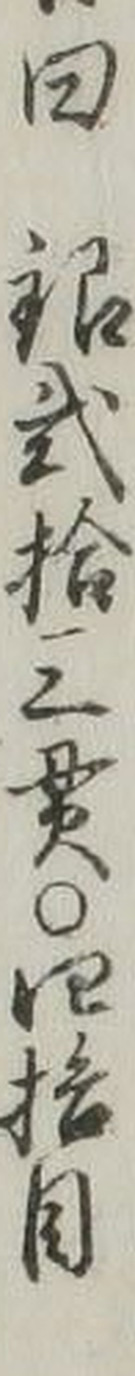答曰銀弐拾三貫〇四拾目
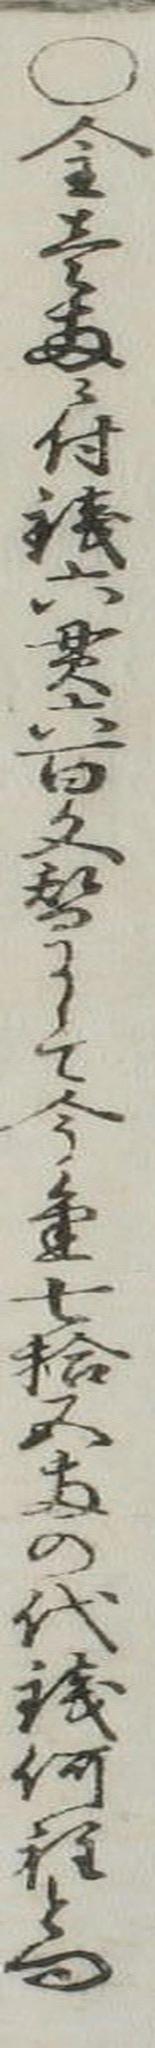○金壱両に付銭六貫六百文替にして今金七拾五両の代銭何程と問
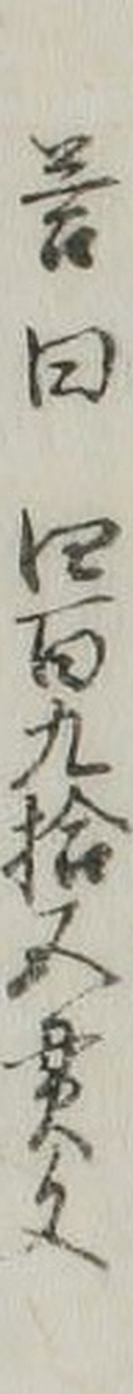答曰四百九拾五貫文
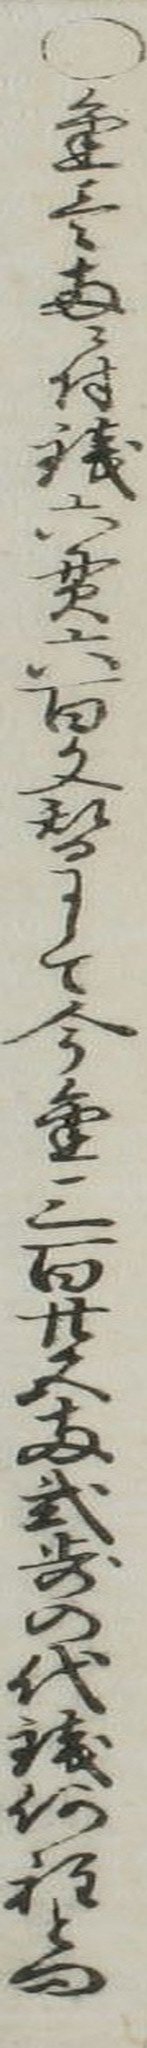○金壱両に付銭六貫六百文替にして今金三百廿五両弐歩の代銭何程と問
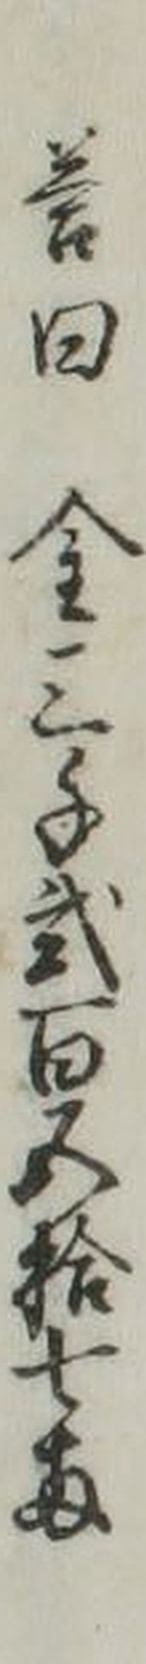答曰金三千弐百五拾七両

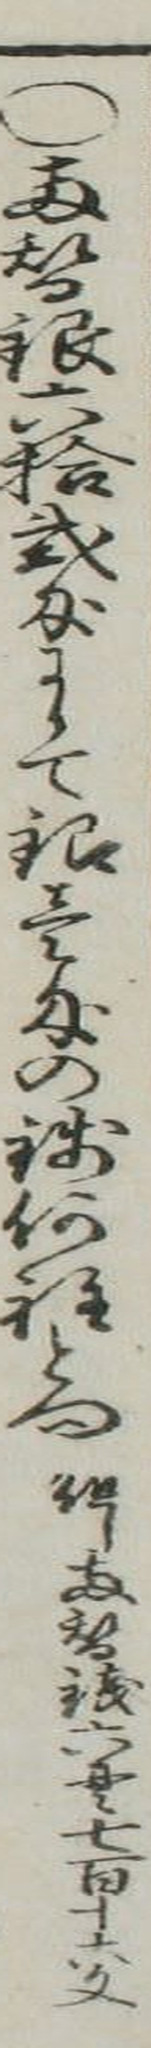○両替銀六拾弐匁にして銀壱匁の銭何程と問但し両替銭六貫七百十六文
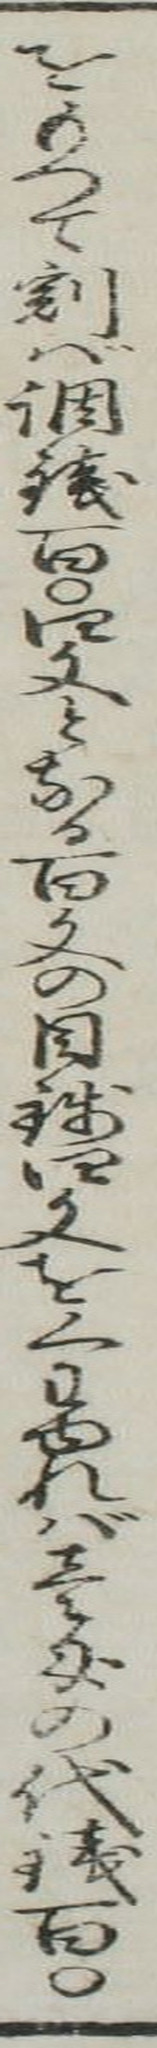をもつて割ば調銭百〇四文となる百文の目銭四文をくわゆれば壱匁の代銭百〇
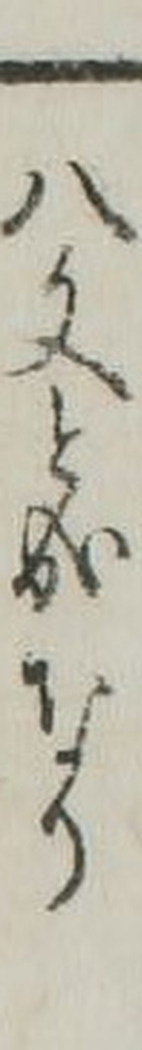八文と成なり
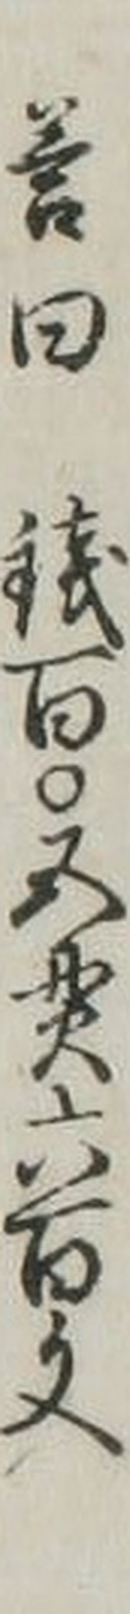答曰銭百〇五貫六百文
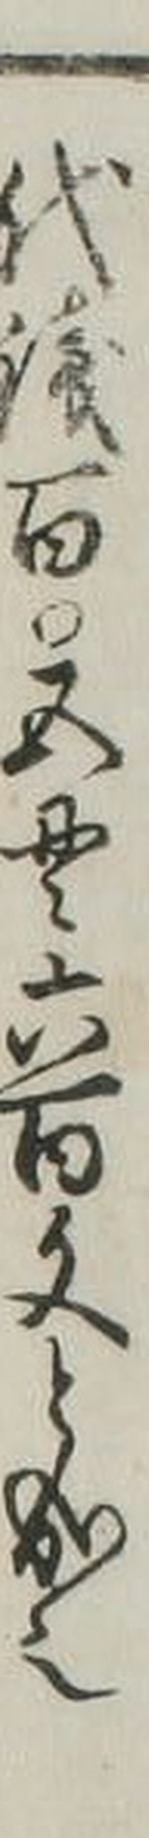代銭百〇五貫六百文と成也
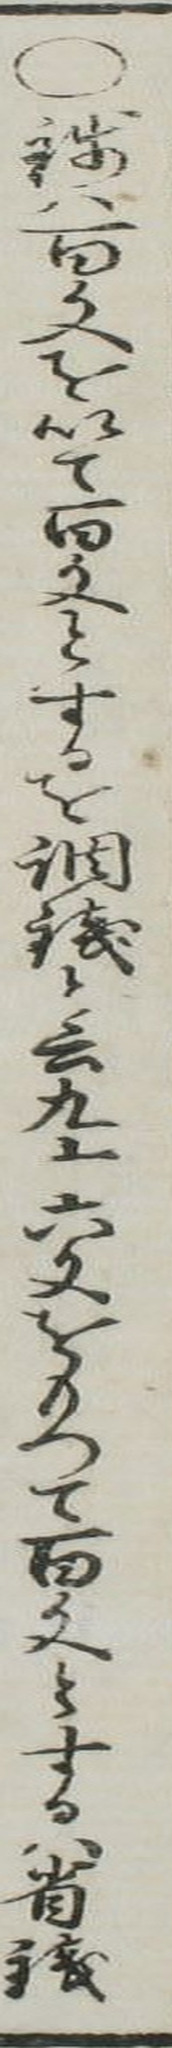○銭は百文を以て百文とするを調銭と云九十六文をもつて百文とするは省銭
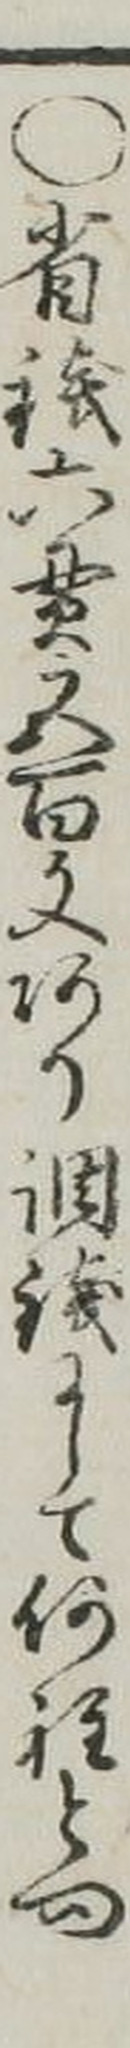○省銭六貫五百文あり調銭にして何程と問
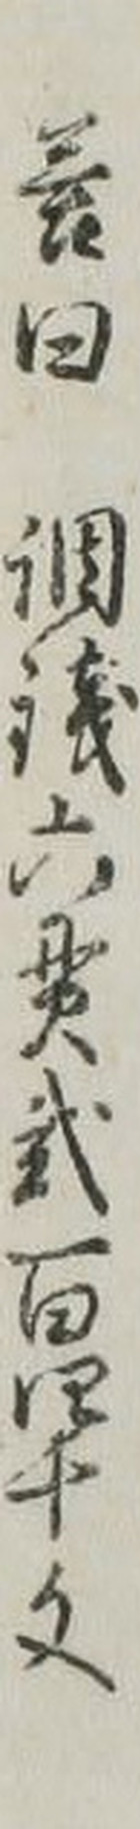答曰調銭六貫弐百四十文
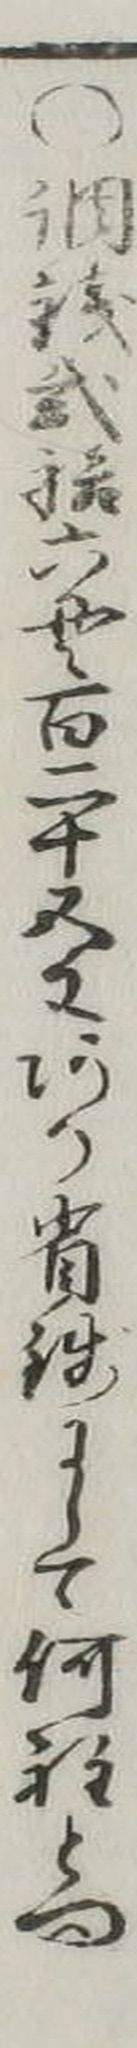○調銭弐拾六貫百二十五文あり省銭にして何程と問
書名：宝玉塵劫記
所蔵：東京学芸大学教育コンテンツアーカイブ
